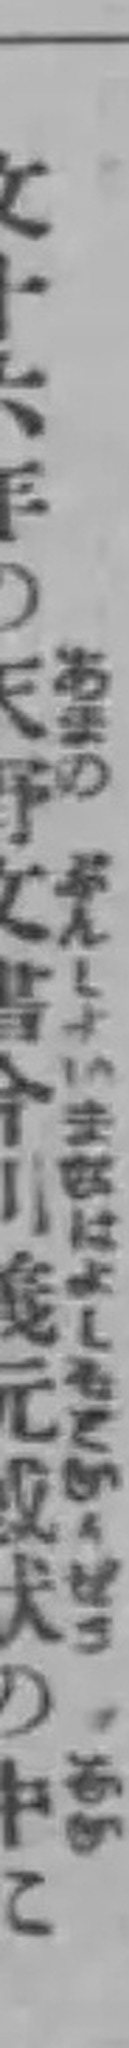文十六年の天野文書今川義元感状の中に
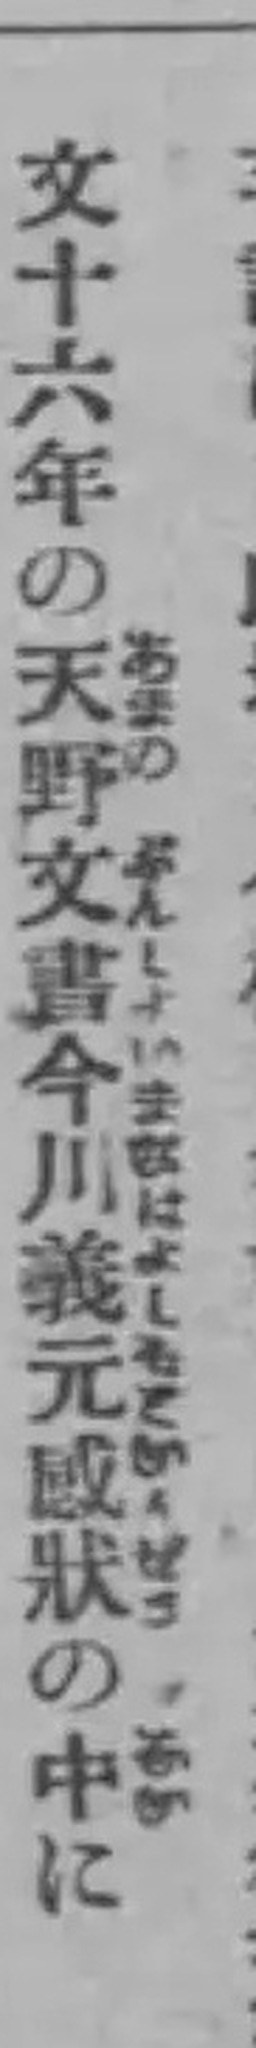文十六年の天野文書今川義元感状の中に
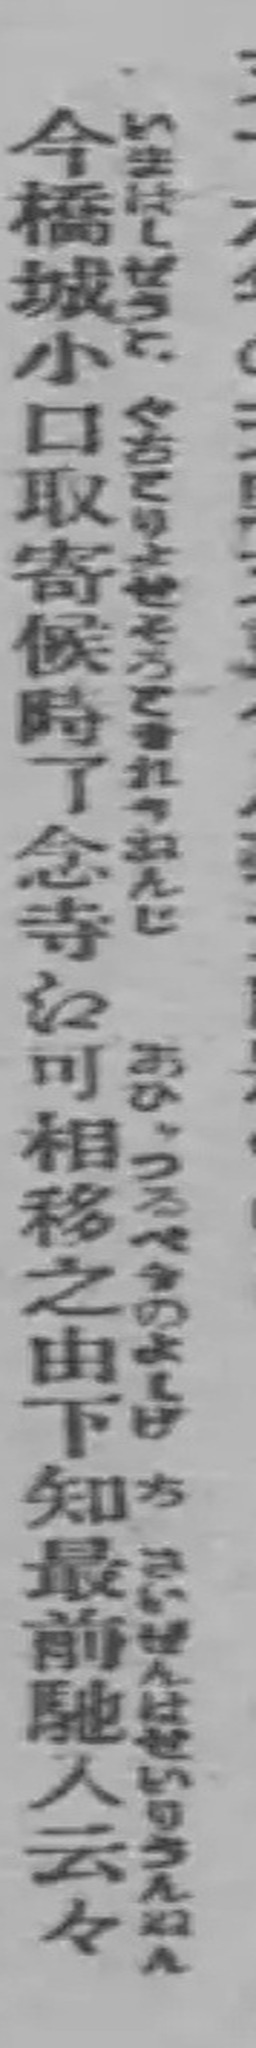今橋城小口取寄候時了念寺え可相移之由下知最前馳入云々
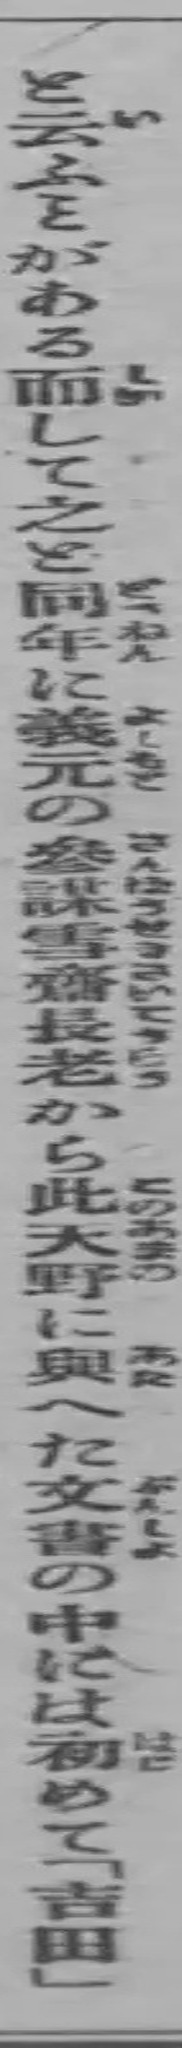と云ふことがある而して之と同年に義元の参謀雪斎長老から此天野に与へた文書の中には初めて「吉田」
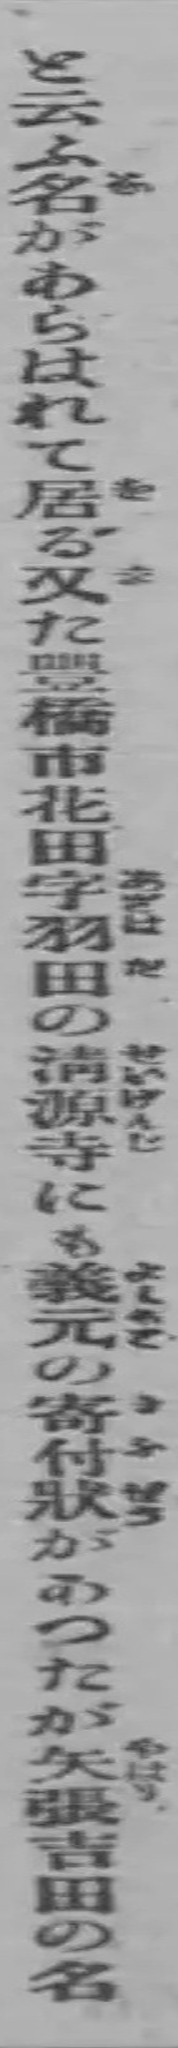と云ふ名があらはれて居る又た豊橋市花田字羽田の清源寺にも義元の寄付状があつたが矢張吉田の名
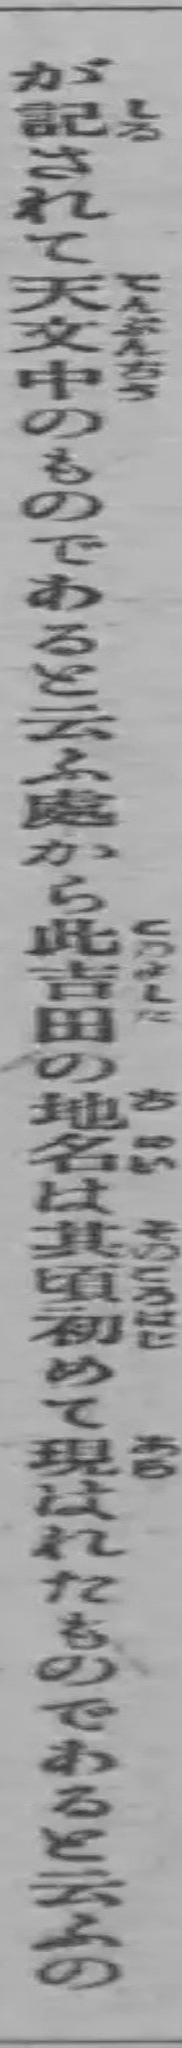が記されて天文中のものであると云ふ処から此吉田の地名は其頃初めて現はれたものであると云ふの
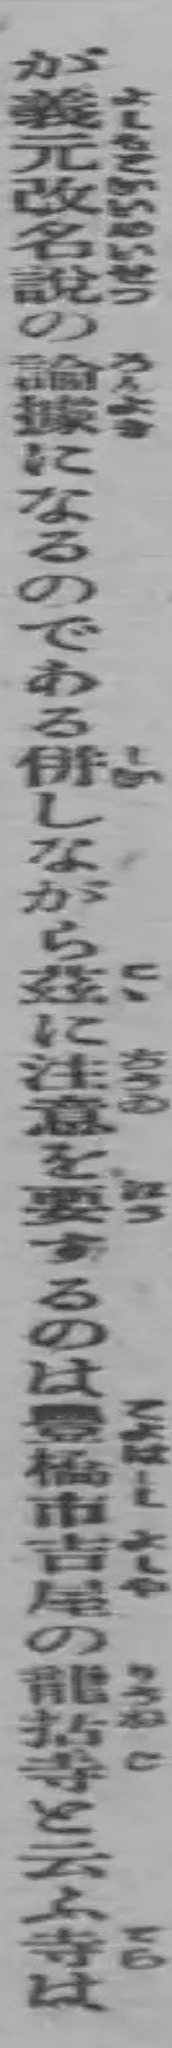が義元改名説の論拠になるのである併しながら茲に注意を要するのは豊橋市吉屋の龍拈寺と云ふ寺は
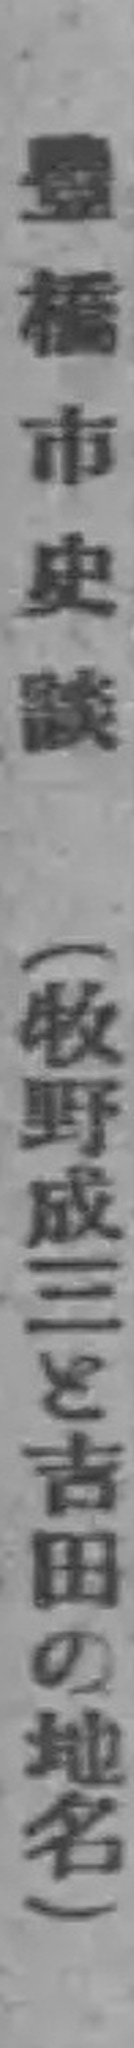豊橋市史談(牧野成三と吉田の地名)廿八

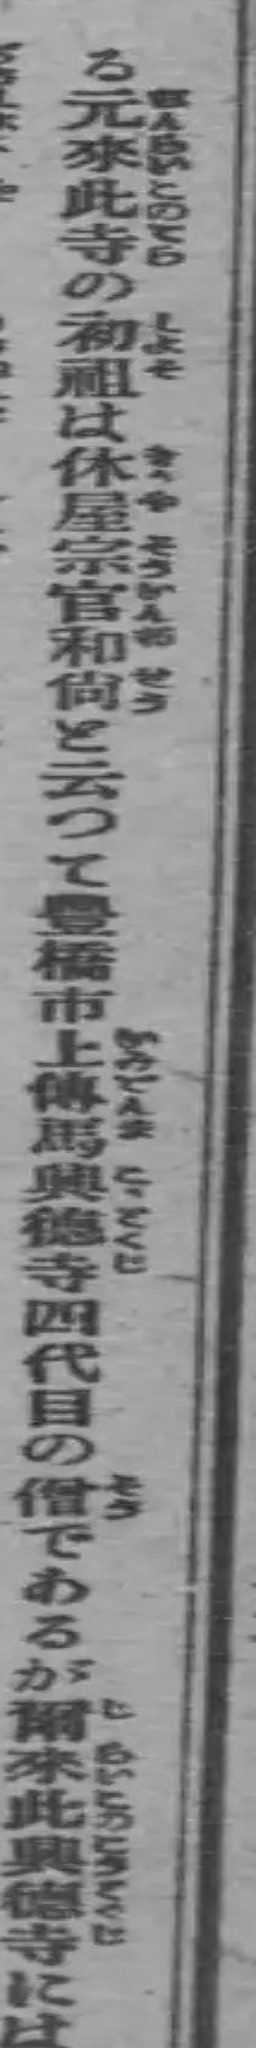る元来此寺の初祖は休屋宗官和尚と云つて豊橋市上伝馬興徳寺四代目の僧であるが爾来此興徳寺には
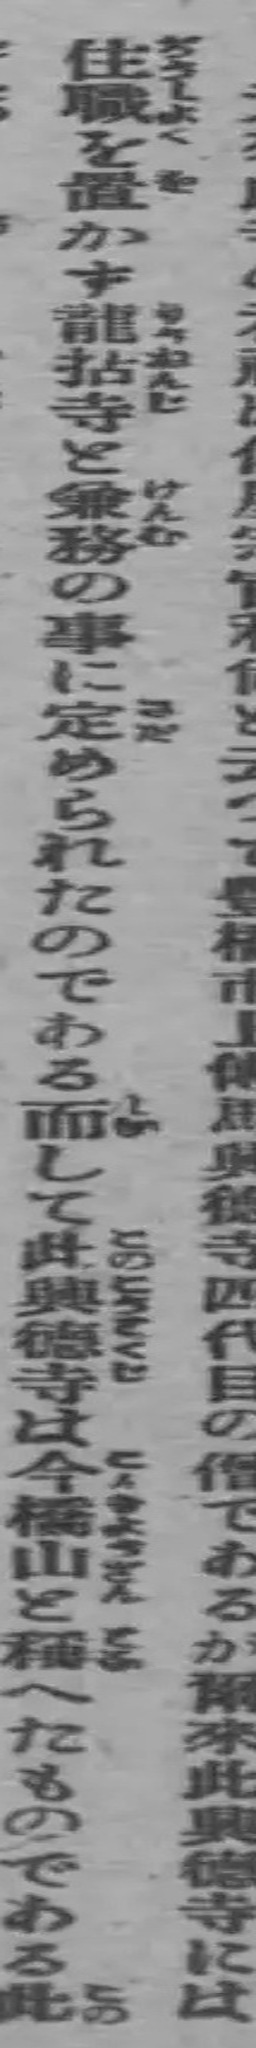住職を置かず龍拈寺と兼務の事に定められたのである而して此興徳寺は今橋山と称へたものでる此
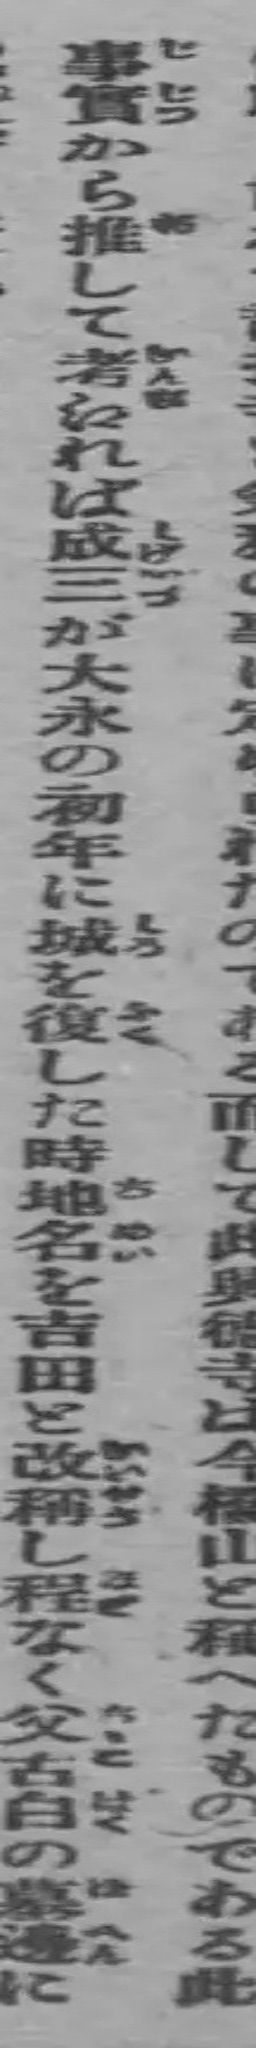事実から推して考えれば成三が大永の初年に城を復した時地名を吉田と改称し程なく父古白の墓辺に
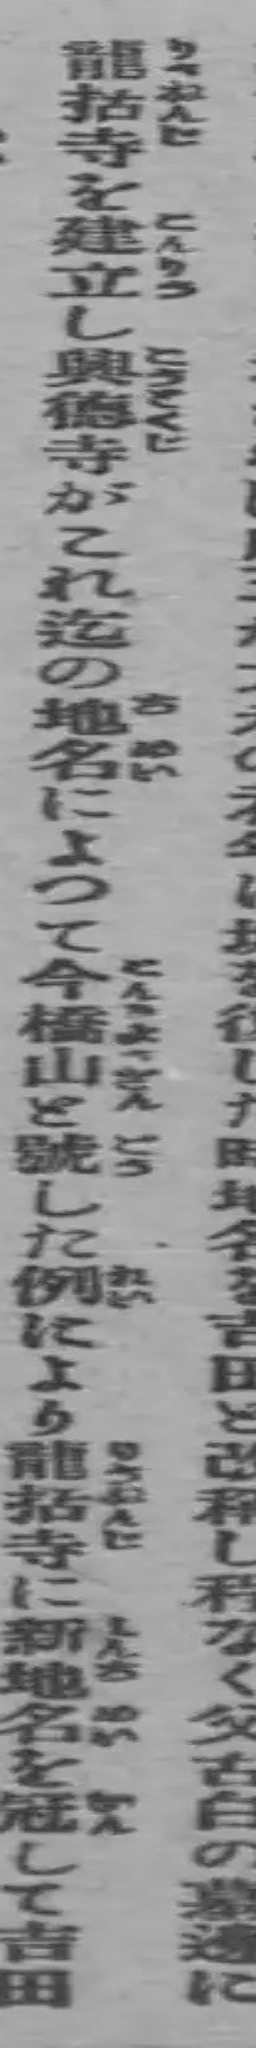龍拈寺を建立し興徳寺がこれ迄の地名によつて今橋山と号した例により龍拈寺に新地名を冠して吉田
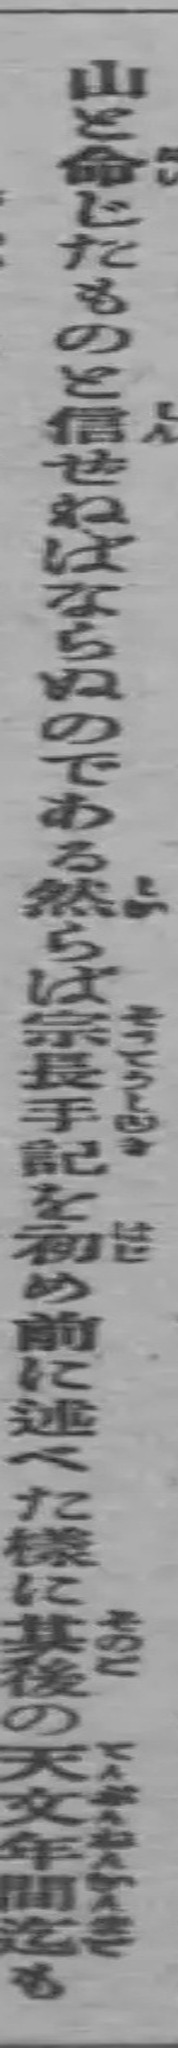山と命じたものと信ぜねばならぬのである然らば宗長手記を初め前に述べた様に其後の天文年間迄も
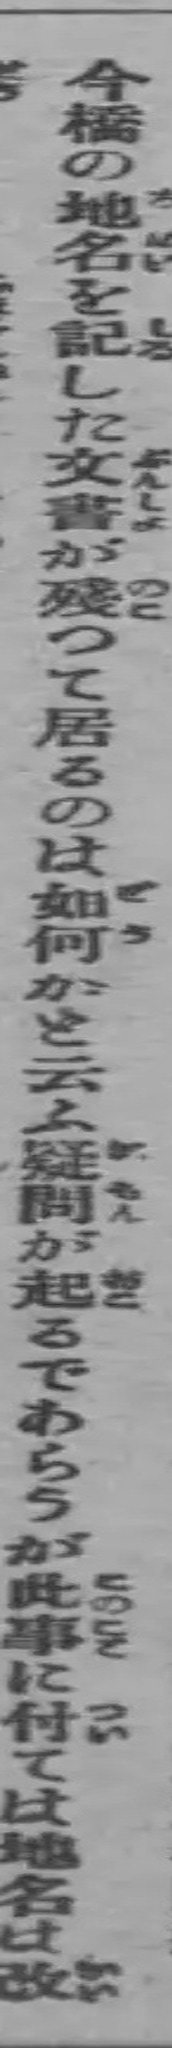今橋の地名を記した文書が残つて居るのは如何かと云ふ疑問が起るであらうが此事に付ては地名は改
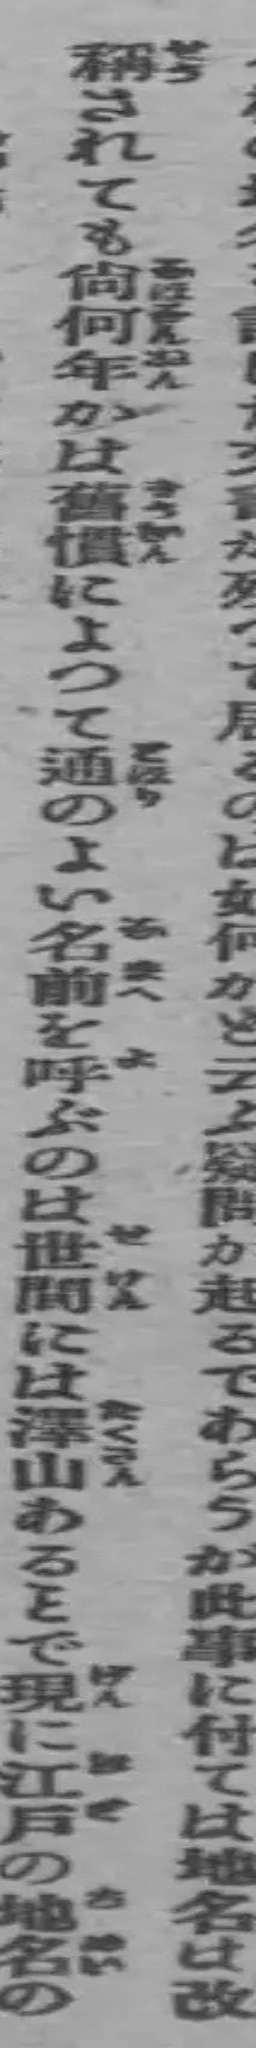称されても尚何年かは旧慣によつて通のよい名前を呼ぶのは世間には沢山あることで現に江戸の地名の
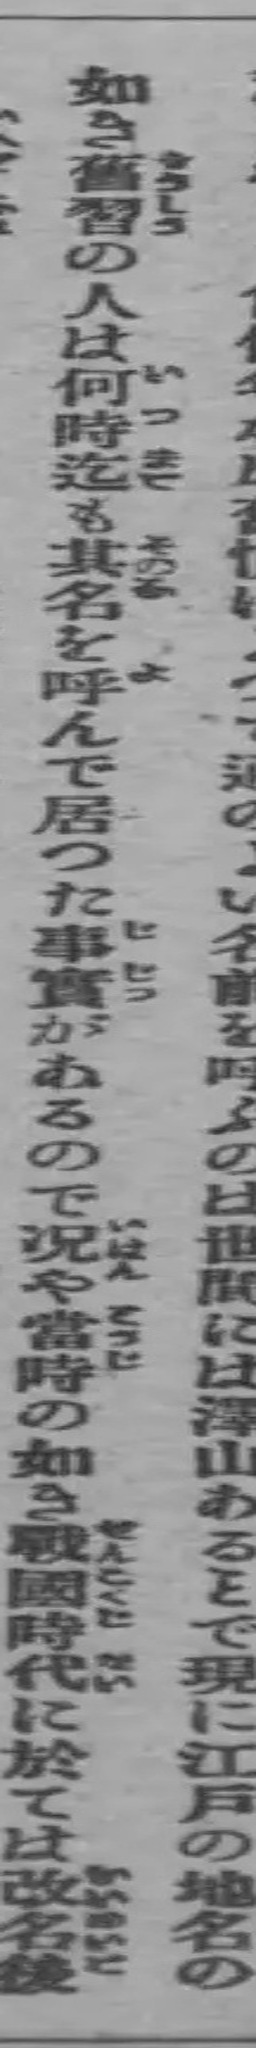如き旧習の人は何時迄も其名を呼んで居つた事実があるので況や当時の如き戦国時代に於ては改名後
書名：豊橋市史談
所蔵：国立国会図書館 National Diet Library, JAPAN
